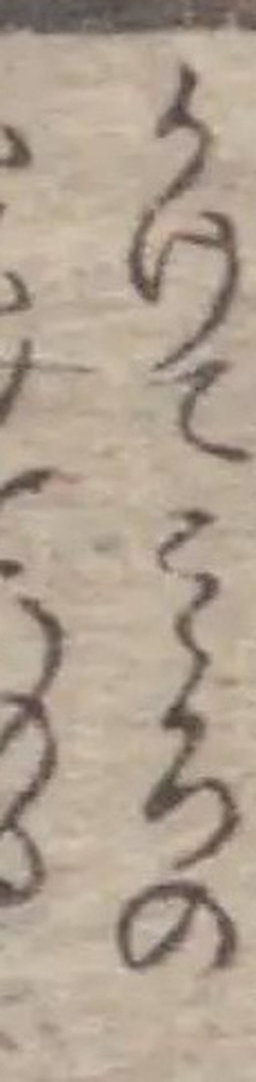たけをいのる
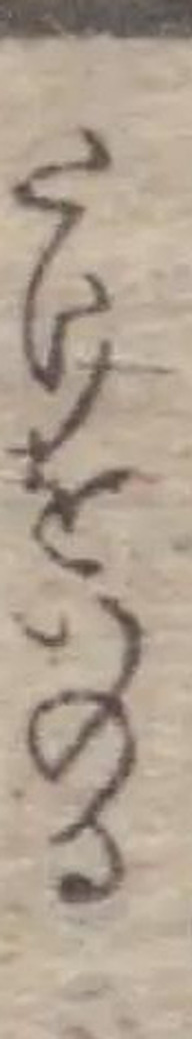たけをいのる
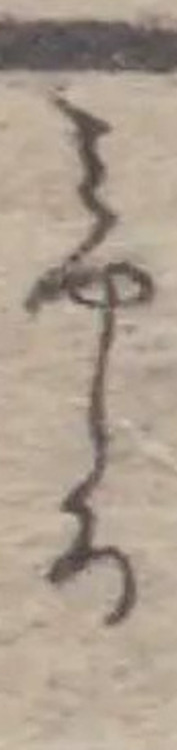みやしろ

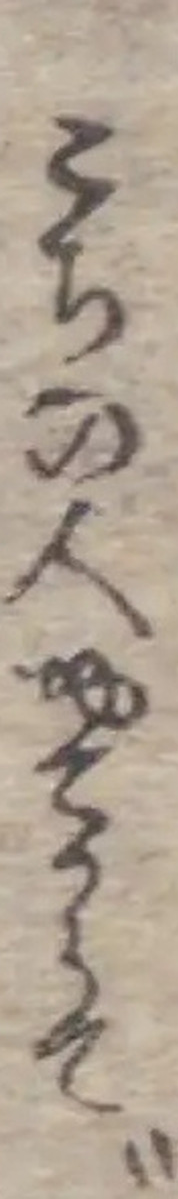こちのひとおてからて
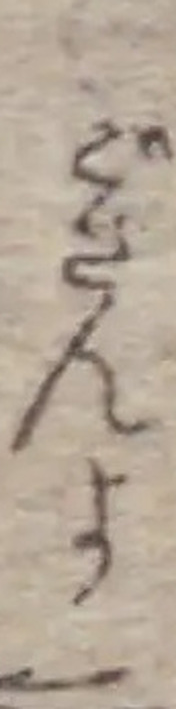ごさんす
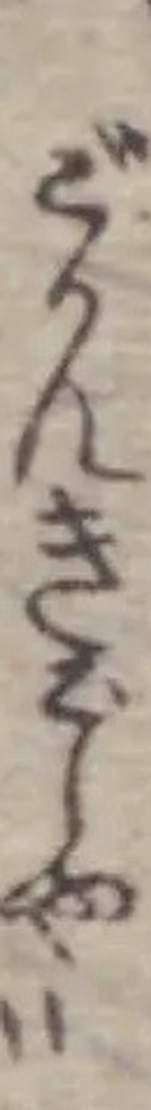ごかんきごしや
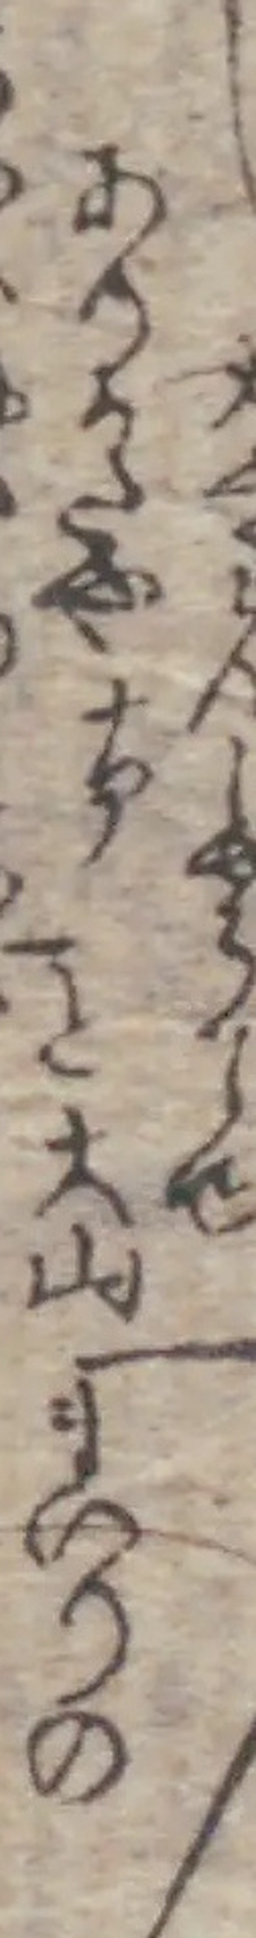ありがたやナアと大山まいりの
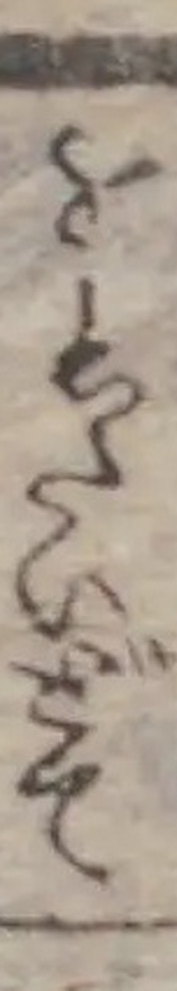をちたいどて
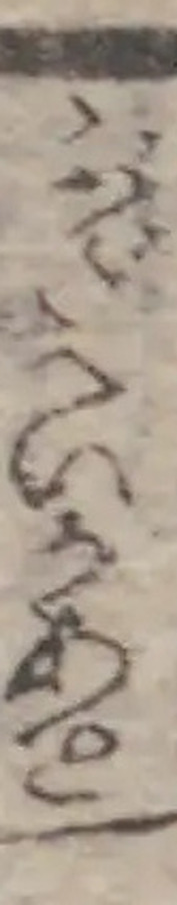ぶだへいかあと
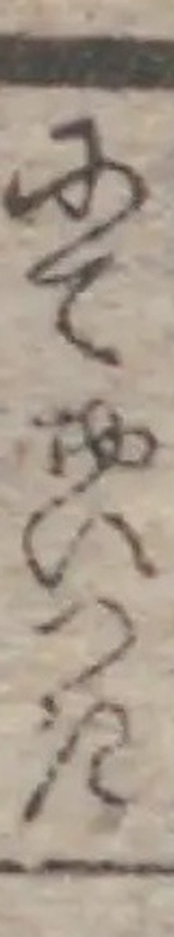にておいつき
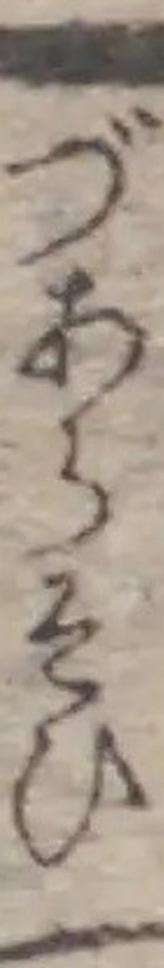づあらそひ
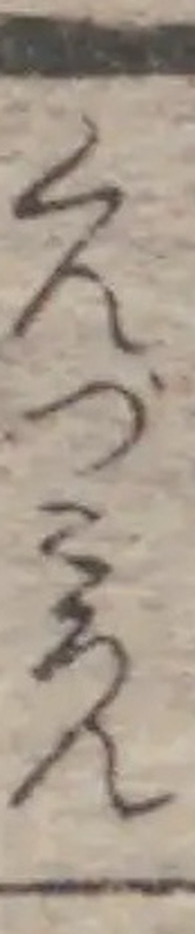くんづころん
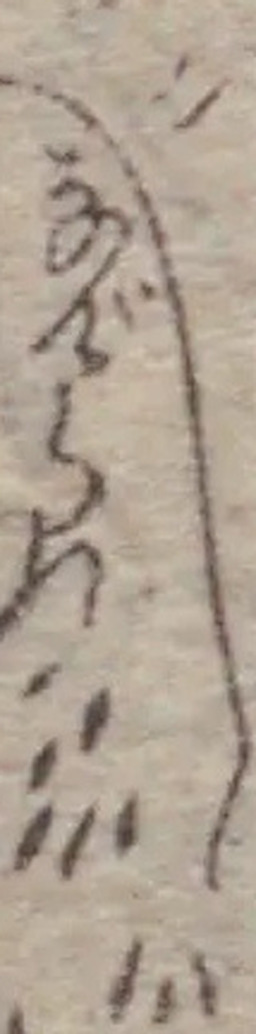なげられ
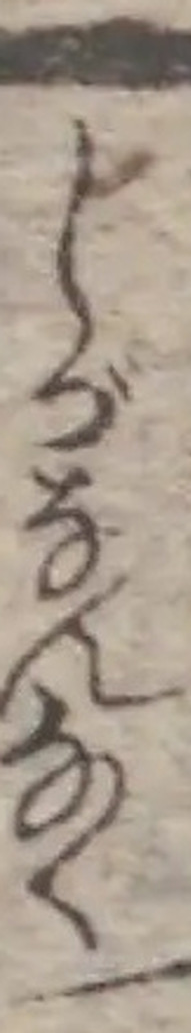しがなんなく
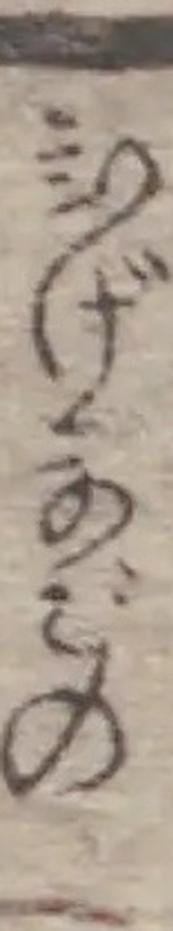ひげなでの
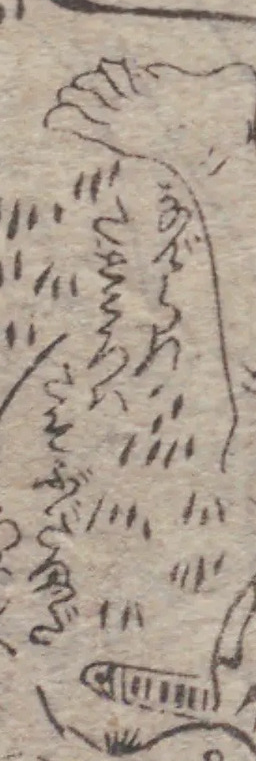たところは
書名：富多高慢噺 3巻
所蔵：国立国会図書館 National Diet Library, JAPAN
